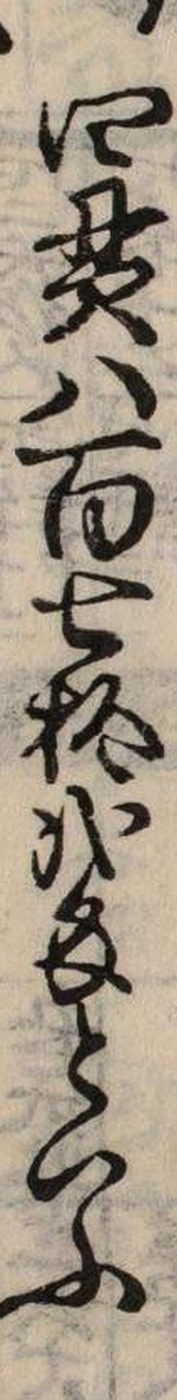銀四貫八百七拾弐匁といふ
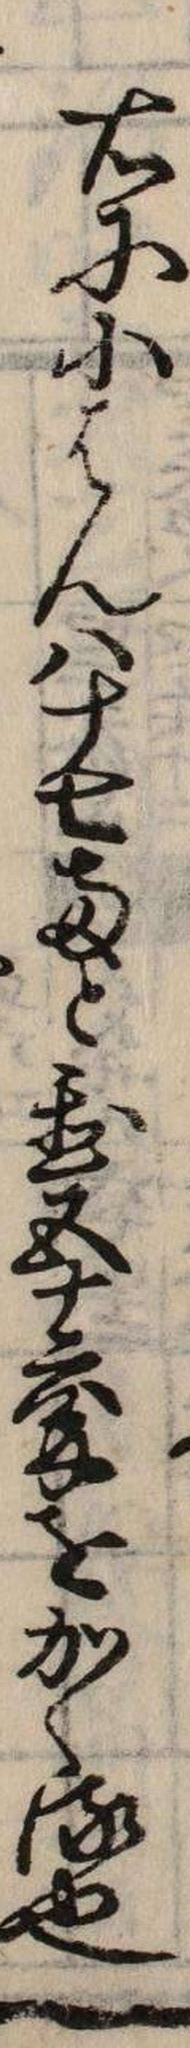右に小はん八十七両と置五十六匁をかくる也
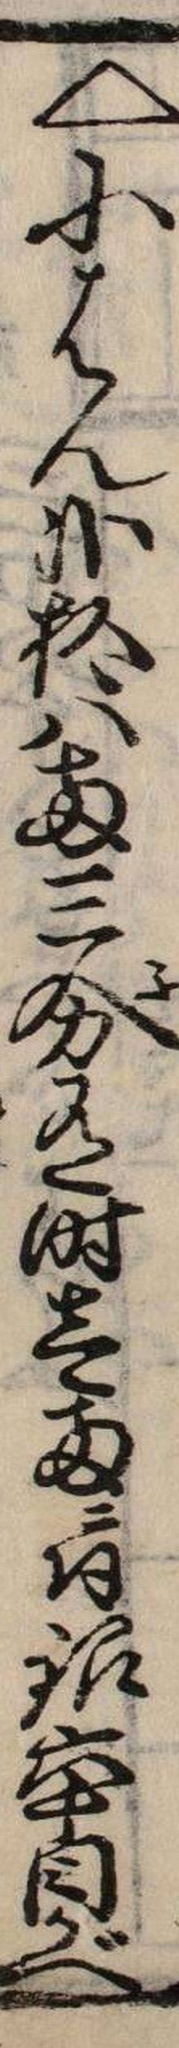△小はん弐拾八両三分有時壱両に付銀六十目がへ
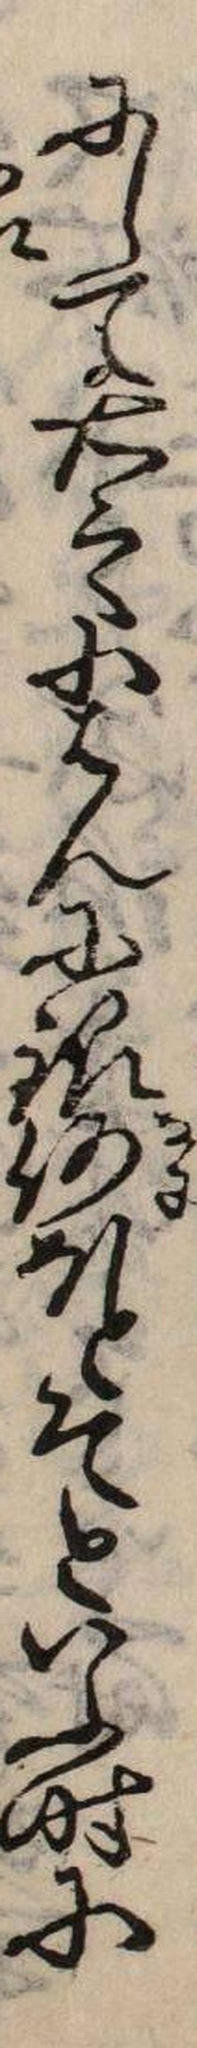にして右の小はんに銀何ほとそといふ時に
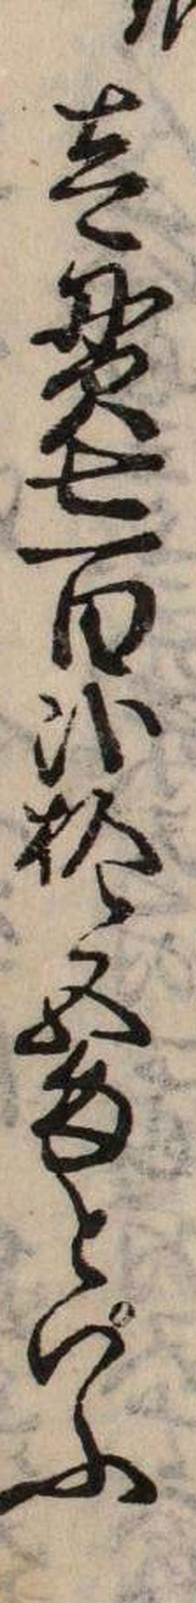銀壱貫七百弐拾五両といふ
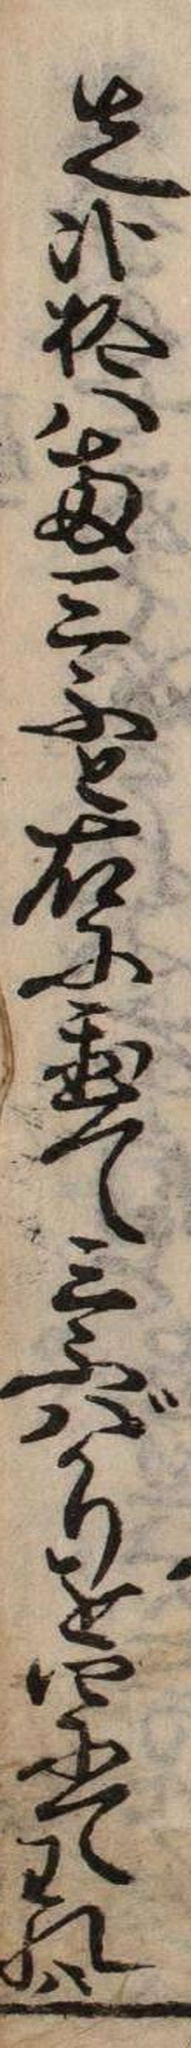先弐拾八両三ふと右に置て三ふばかりを四にてわれは

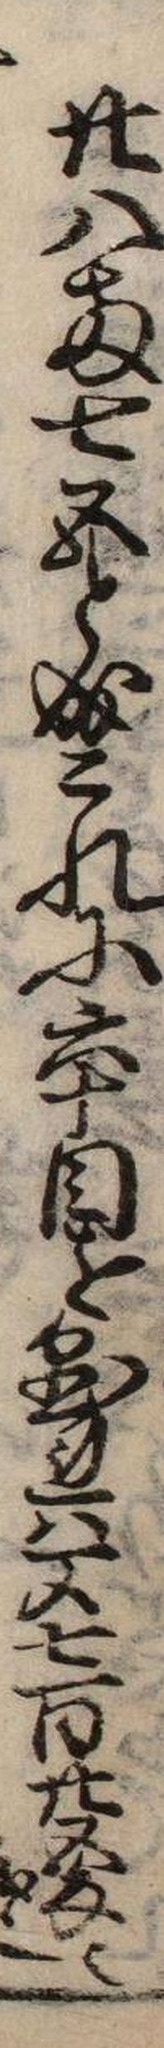廿八両七五と成これに六十目をかくれは一貫七百廿五両と成也
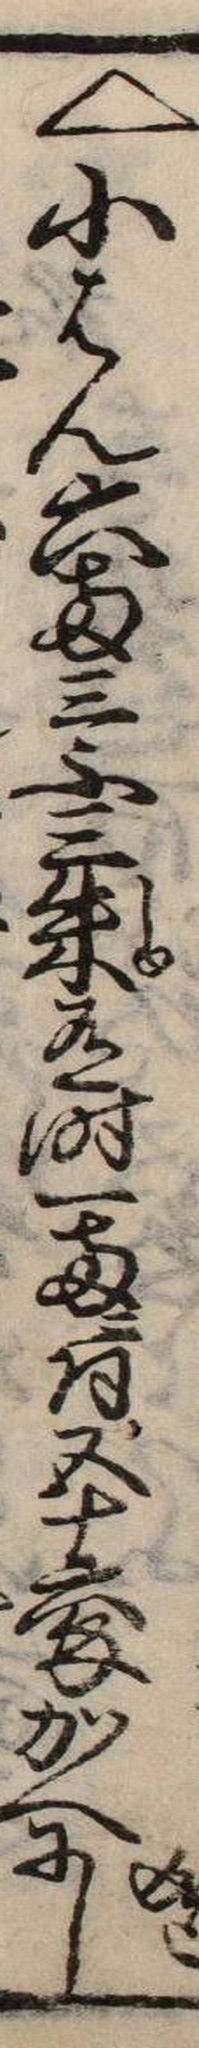△小はん六両三ふ三朱有時一両に付五十六両かへにし
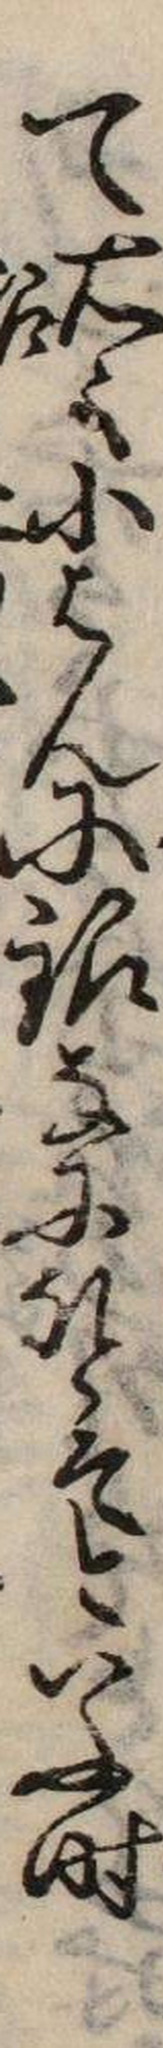て右の小はんに銀なにほとそといふ時
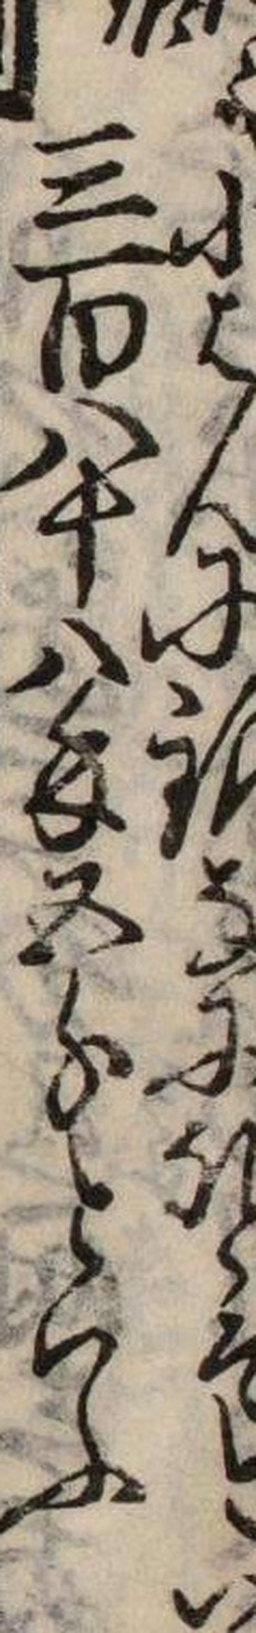銀三百八十八匁五分といふ
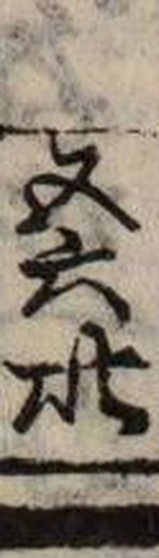五六卅
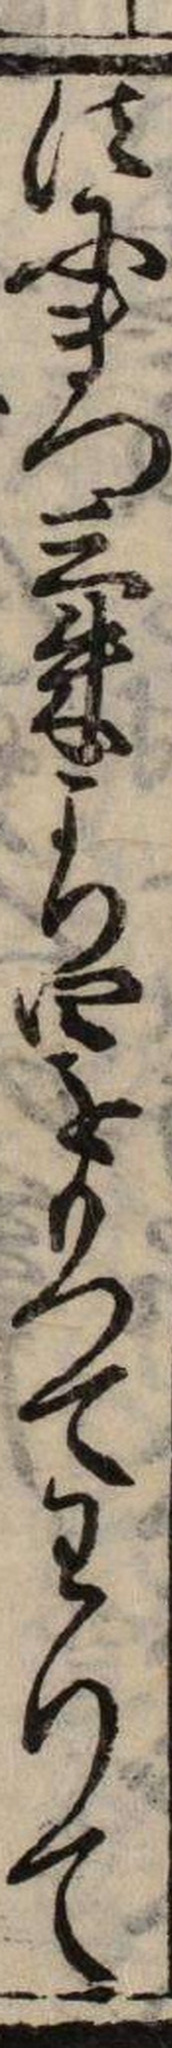法にまつ三朱より四をもつてわりて
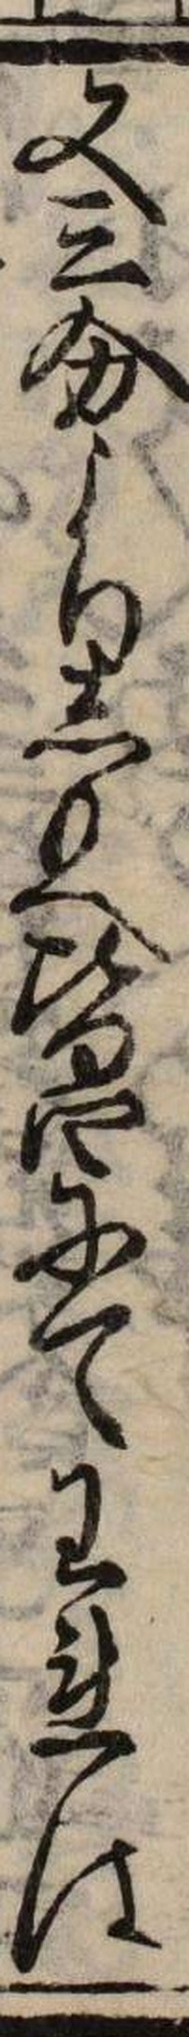一６又三分よりしもへ皆四にてわれは
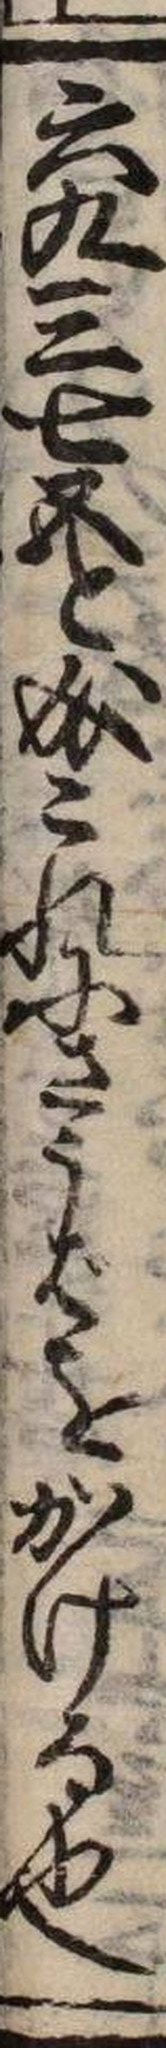十５六九三七五と成これにさうばをかける也
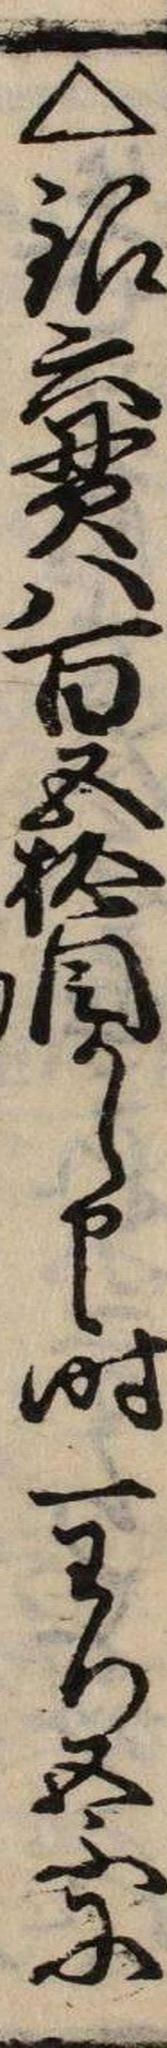△銀六貫八百五拾目かし申時一わり五ふに
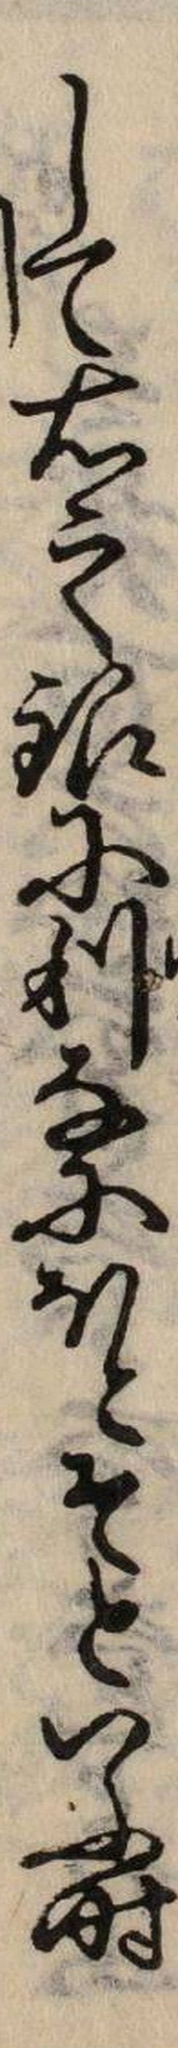して右の銀に利なにほとそといふ時
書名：塵劫記（寛永11年自跋、京都府立京都学・歴彩館追貴8）
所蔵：京都府立京都学・歴彩館 国文学研究資料館
